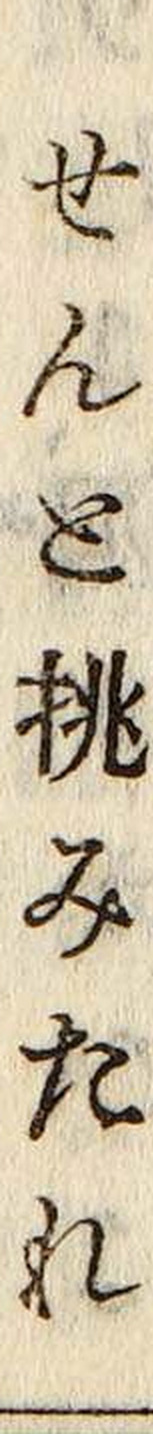せんと挑みたれ
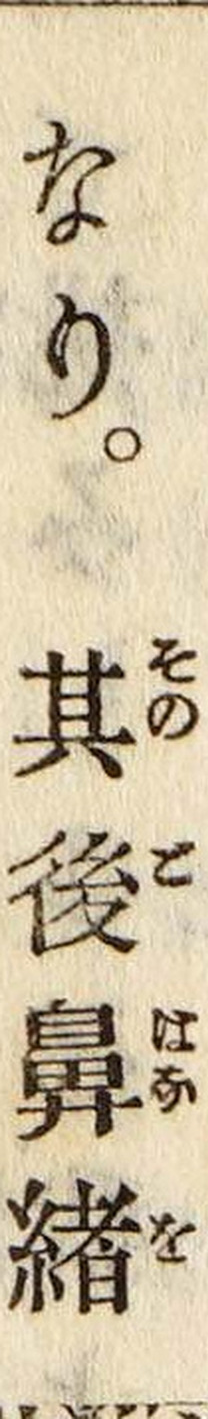なり。其後鼻緒
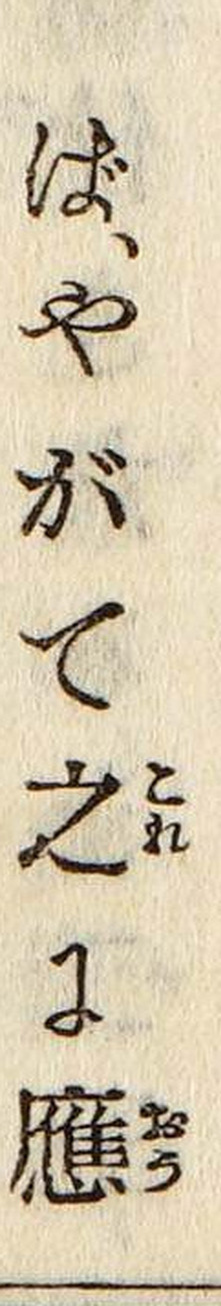ば、やがて之に応
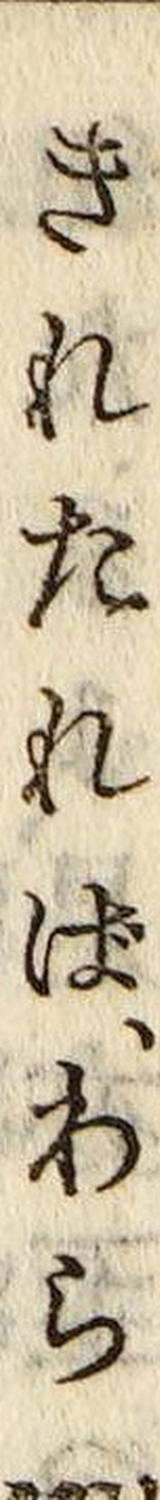きれたれば、わら
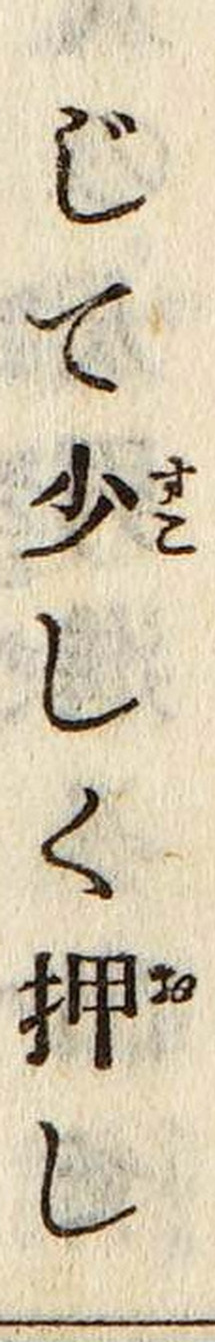じて少しく押し
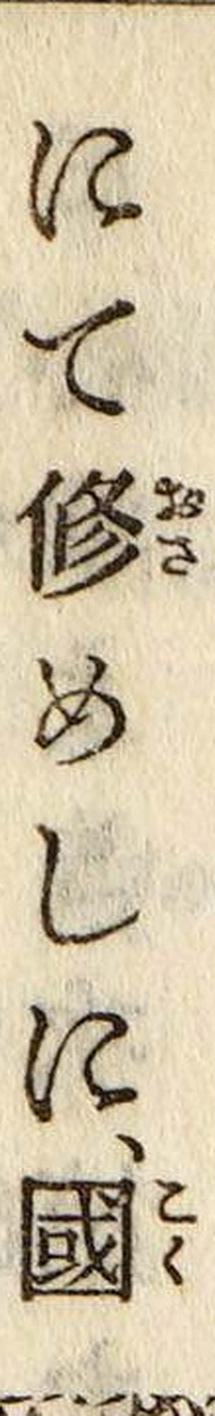にて修めしに、国
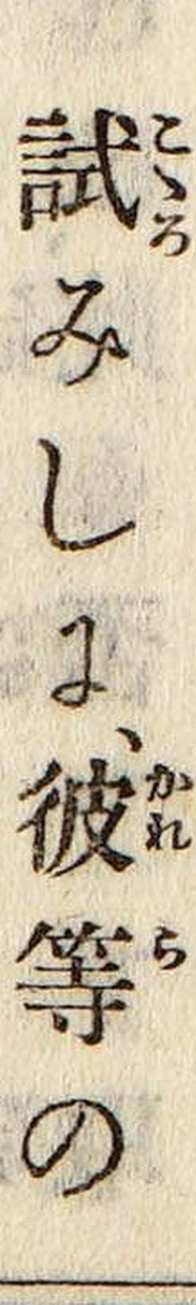試みしに、彼等の
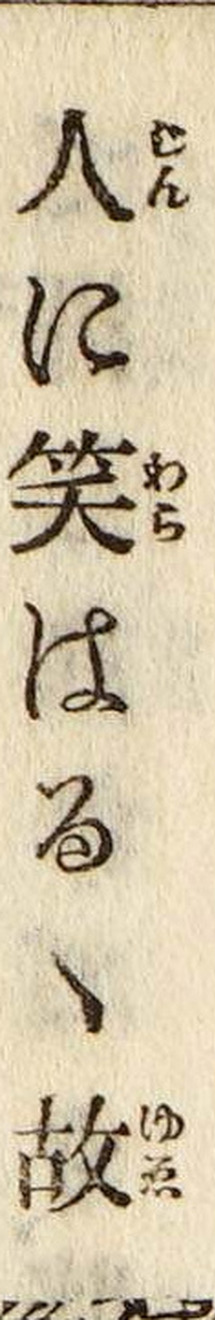人に笑はるヽ故
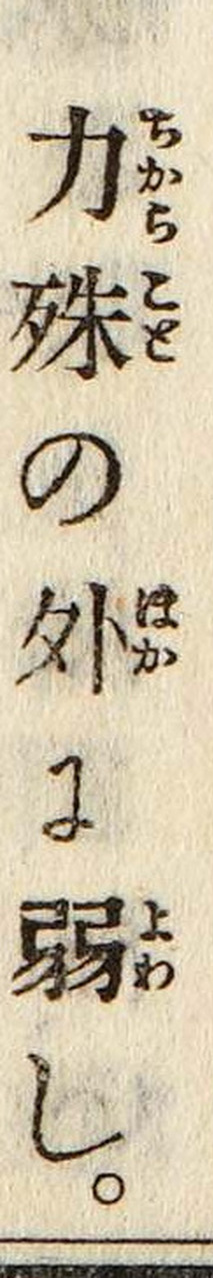力殊の外に弱し。
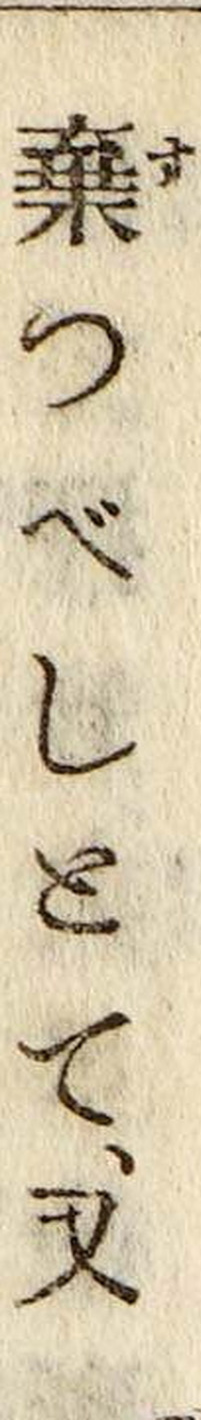棄つべしとて、又
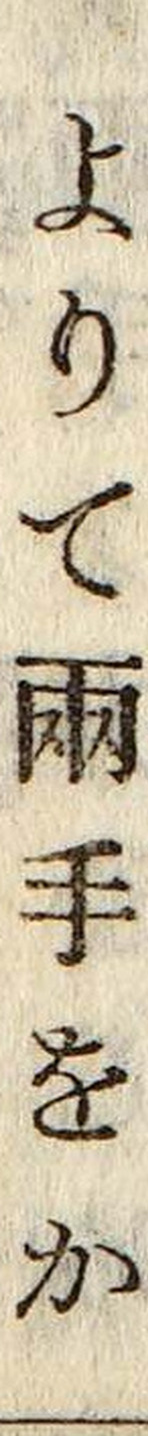よりて両手をか

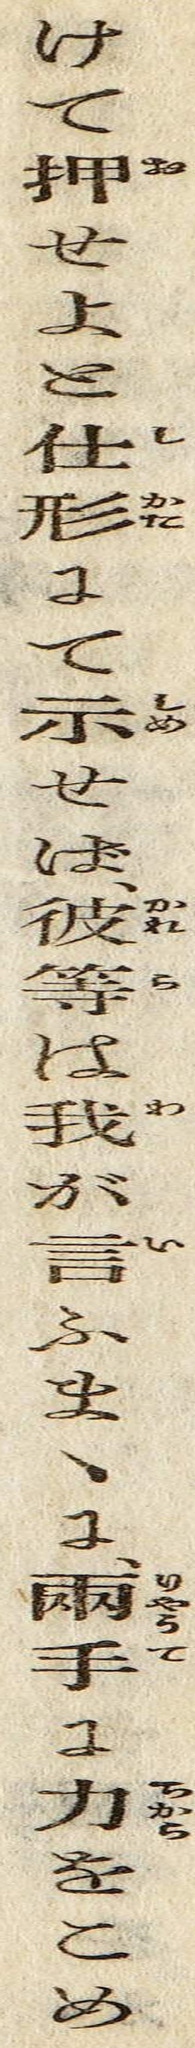けて押せよと仕形にて示せば、彼等は我が言ふまヽに、両手に力をこめ
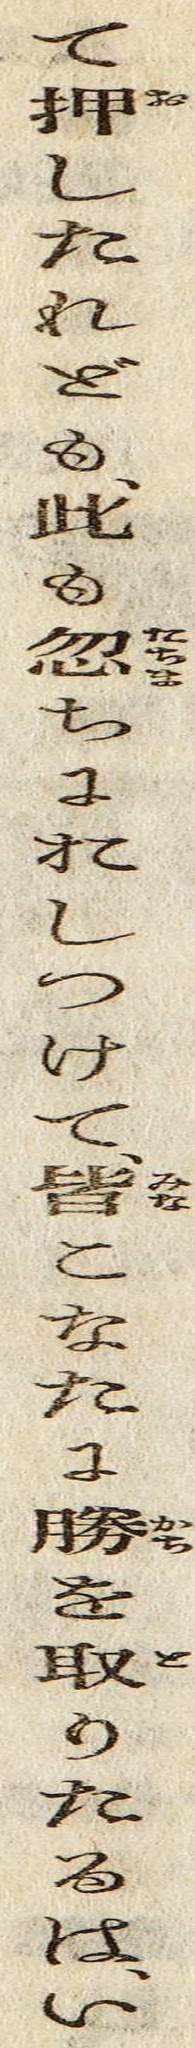て押したれども、此も忽ちにおしつけて、皆こなたに勝を取りたるは、い
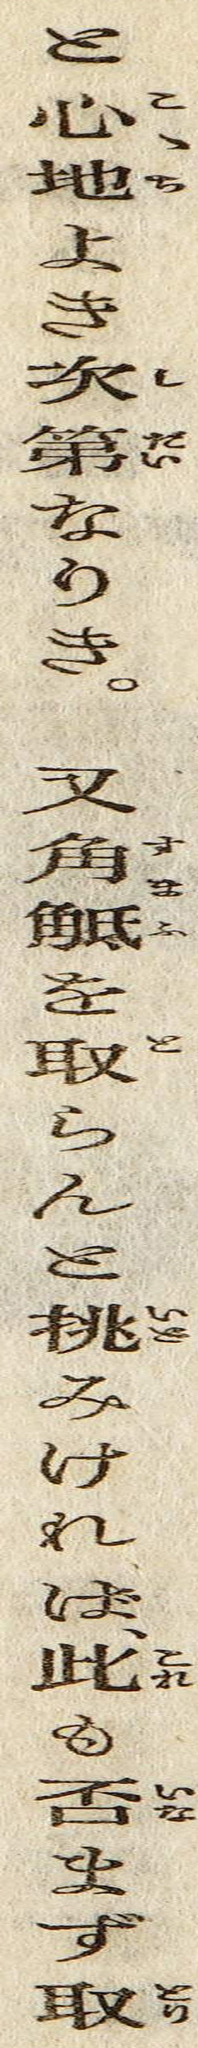と心地よき次第なりき。又角觝を取らんと挑みければ、此も否まず取
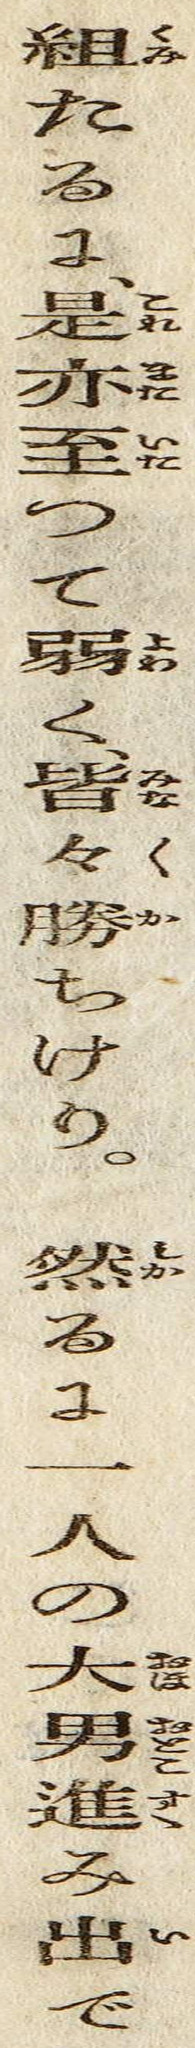組たるに、是亦至つて弱く、皆々勝ちけり。然るに一人の大男進み出で
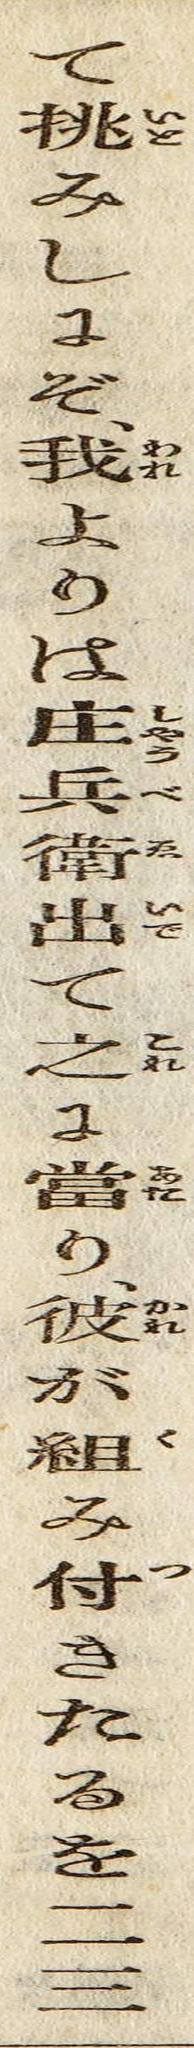て挑みしにぞ、我よりは庄兵衛出て之に当り、彼が組み付きたるを二三
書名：日本漂流譚
